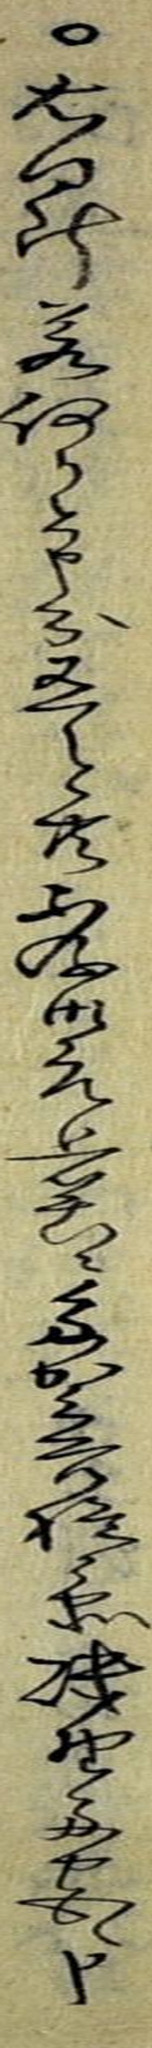○右同断若何かと申分有之候共不及御取上筈に多賀谷権兵衛磯野多宮へ申
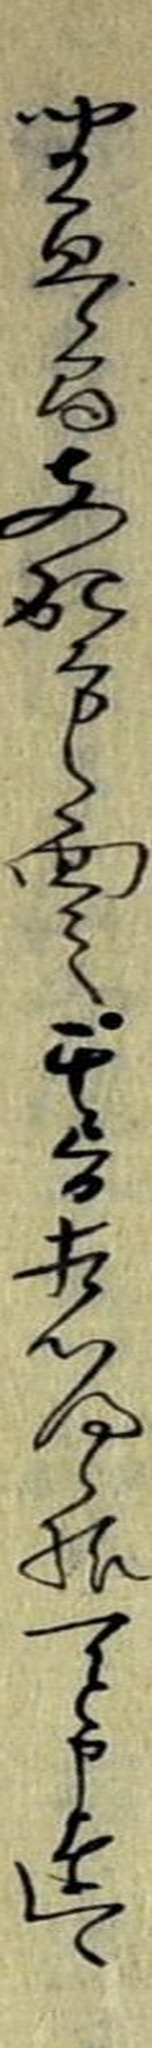聞置候間支配方之面々へ其旨相心得候様被申達候
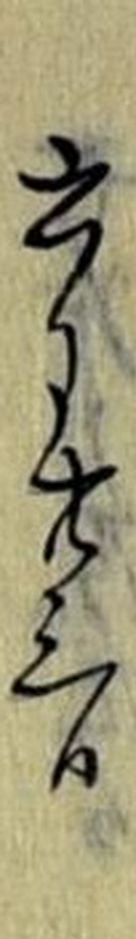六月廿三日
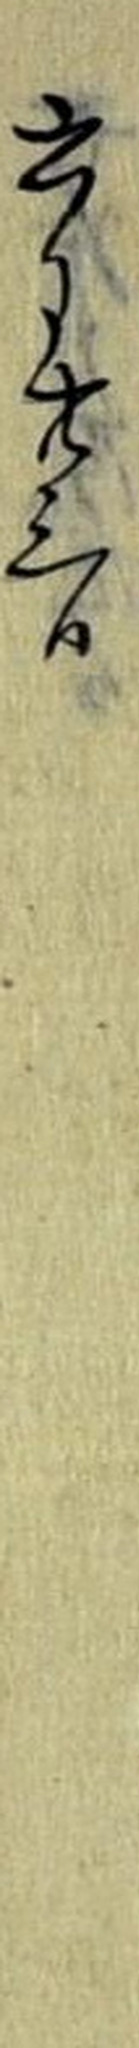六月廿三日
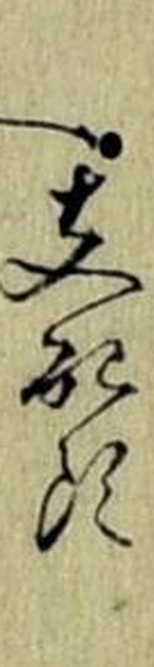支配頭
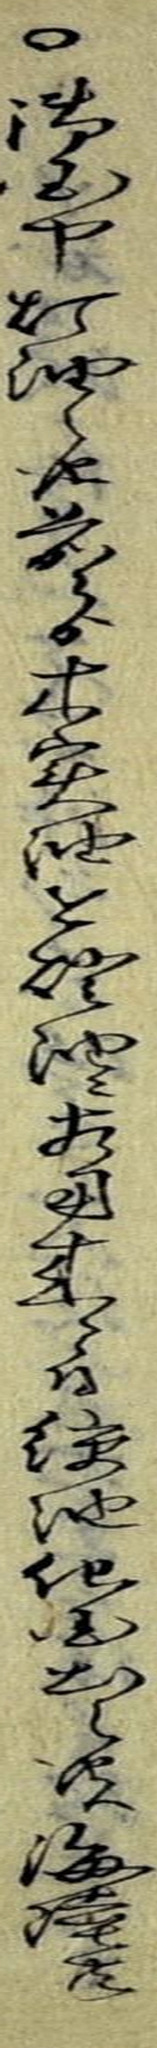○諸国中灯油之儀前々ゟ木実油を灯油に相用来候に付絞油他国出之儀は海陸共
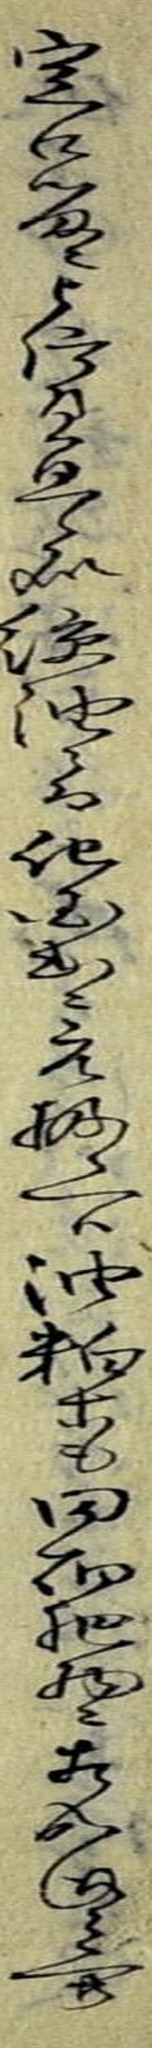定口留に被仰付置候処絞油に而他国出に取扱候へは油粕等も田畑肥物に相成趣に候へ共
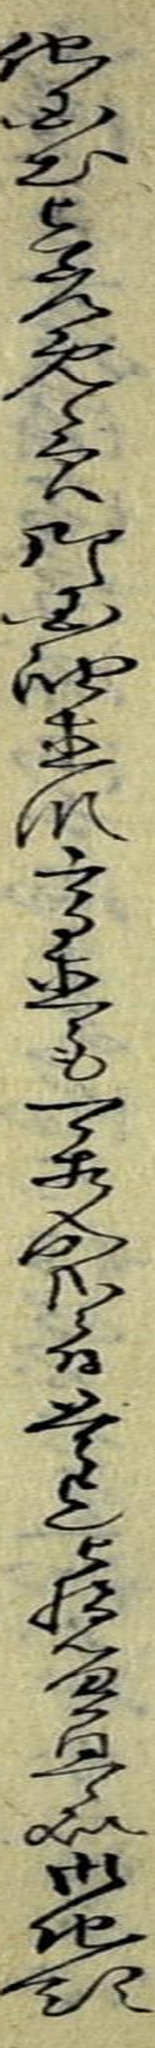他国出被差免候而は御国油直段高直にも可相成哉に付是迄被指留置候処御他領
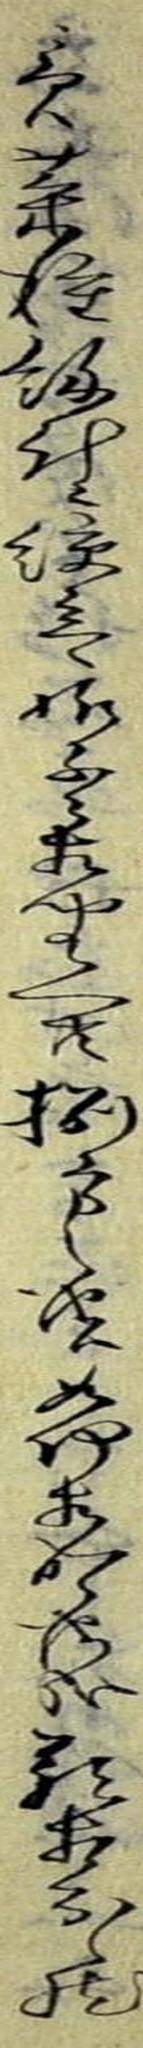に而は菜種余計に絞立候様子に相聞候へ共捌方之儀は如何相成候儀哉難相分候然
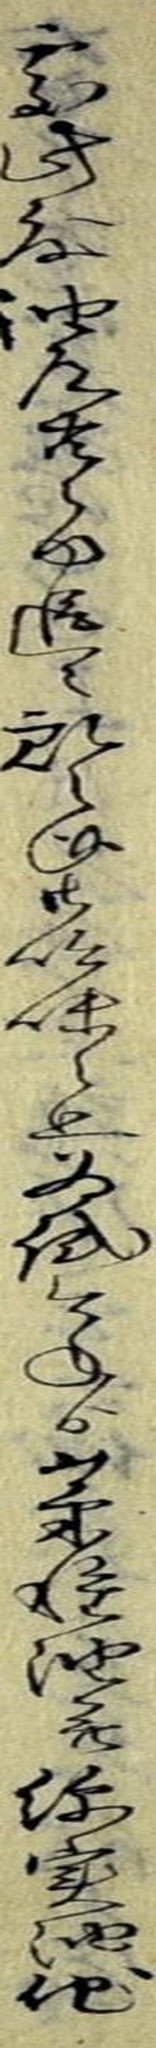処此度油屋共之内追々願趣御吟味之上為試今年ゟ菜種油并綿実油他
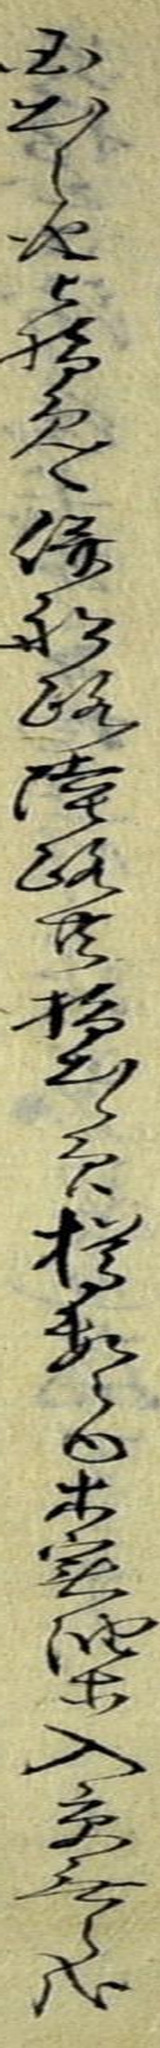国出之儀被差免候併船路陸路共指出候而は樽数之内木実油等入交無之哉
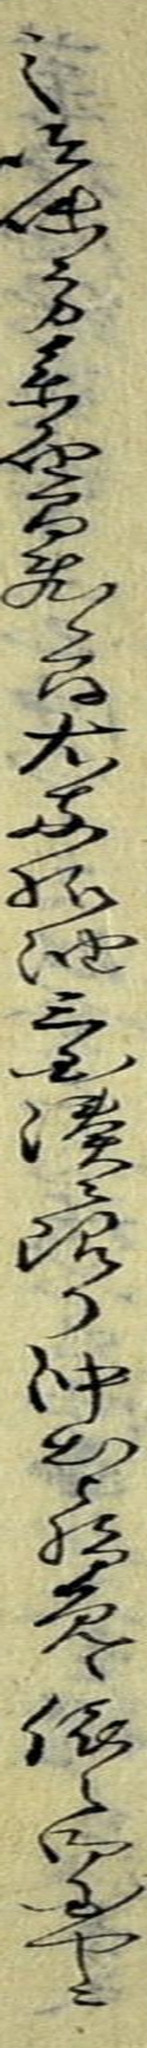之吟味方参届間敷候間右両様油三国湊に限り沖出被指免候依之御国中に
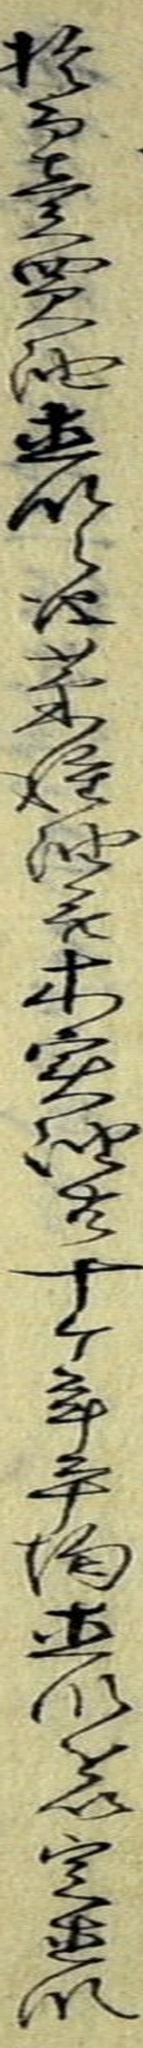於而売買油直段之儀菜種油并木実油共十ヶ年平均直段を以定直段
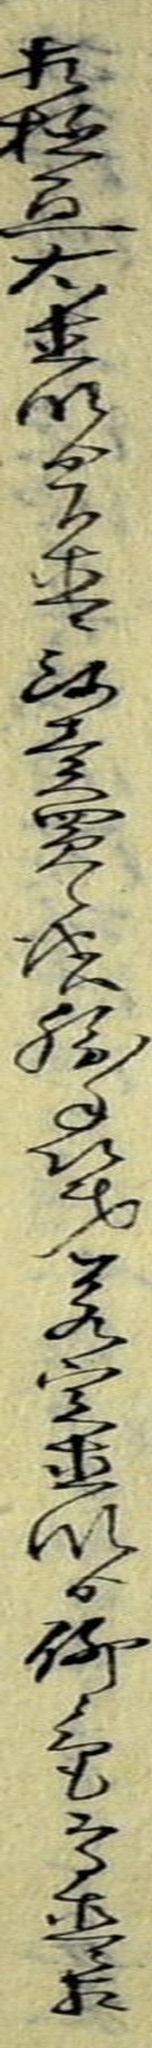相極置右直段ゟ下直に致売買候儀は勝手次第若定直段ゟ聊に而も高直に相
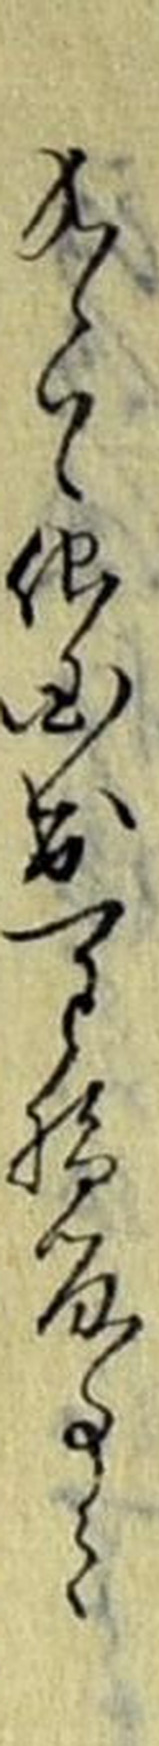成候はヽ他国出可被指留事に候
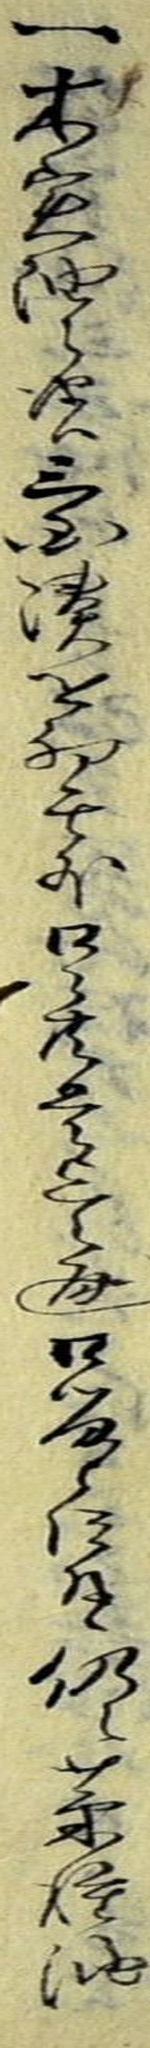一木実油之儀は三国湊を初其外口々共是迄之通口留被仰付候仍之菜種油
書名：命令之部 四
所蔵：福井県文書館 Fukui Prefectural Archives
